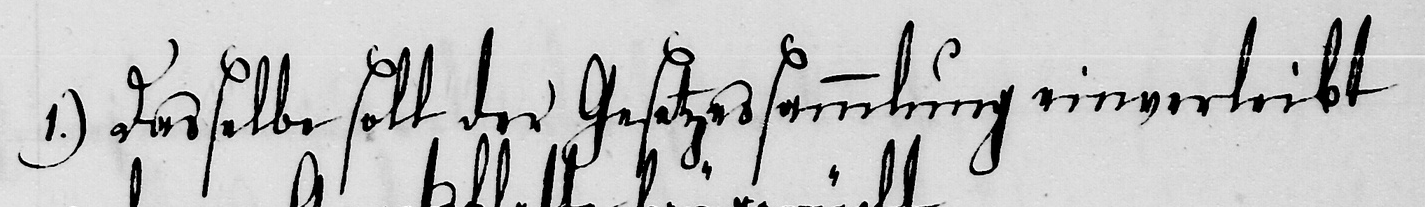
1.) Derselbe soll der Gesetzessammlung einverleibt
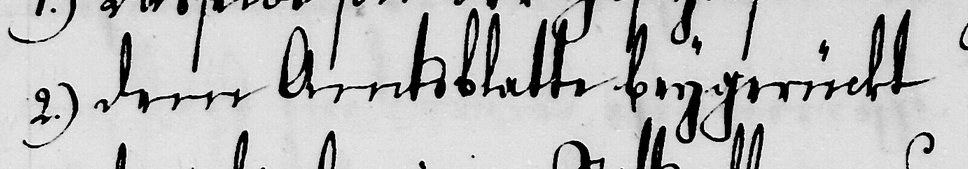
2.) dem Amtsblatte beygerückt,
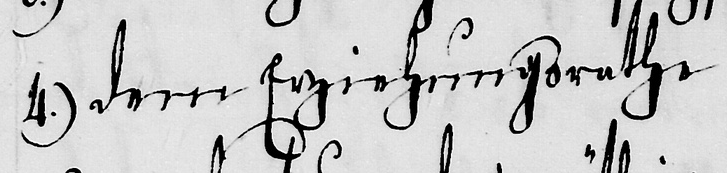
4.) dem Erziehungsrathe
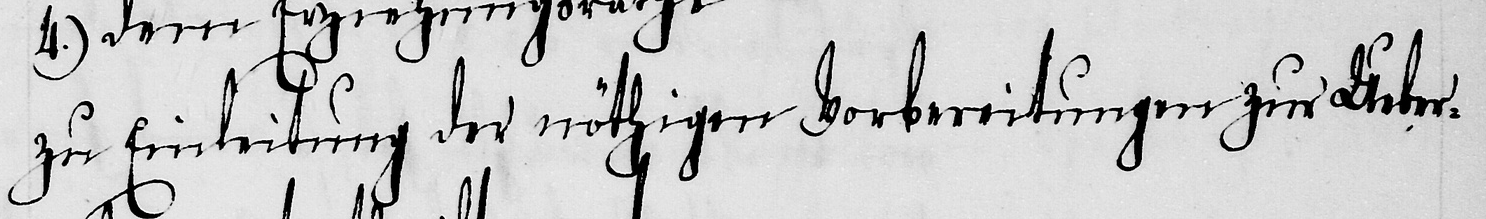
zu Einleitung der nöthigen Vorbereitungen zur Ueber¬
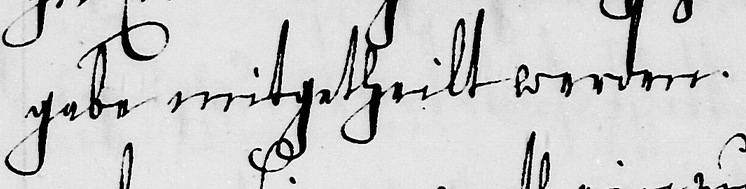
gabe mitgetheilt werden.
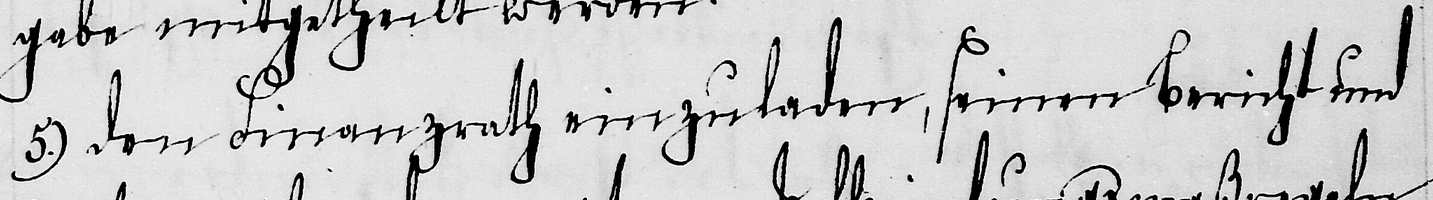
5.) den Finanzrath einzuladen, seinen Bericht und
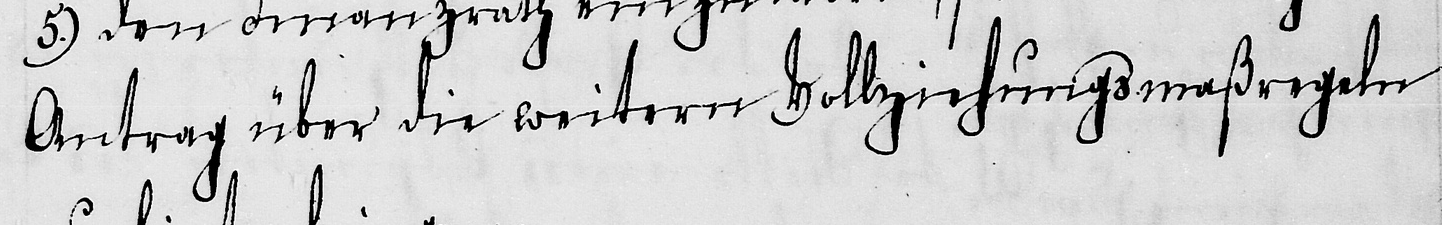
Antrag über die weitern Vollziehungsmaßregeln
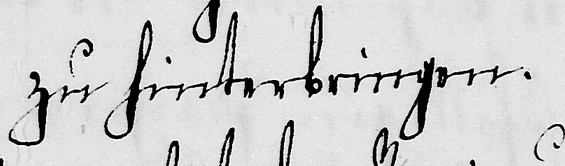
zu hinterbringen.
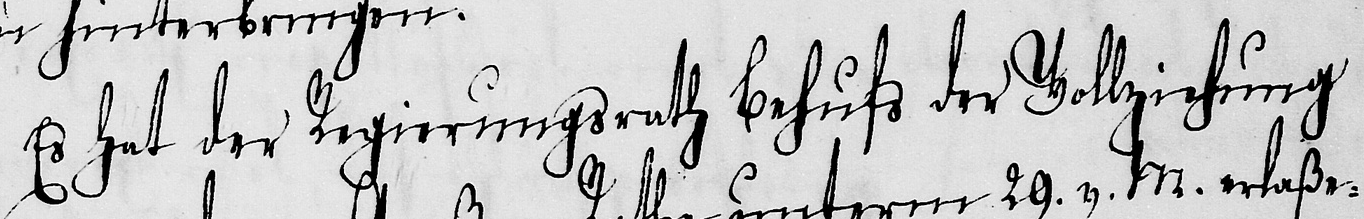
Es hat der Regierungsrath Behufs der Vollziehung
